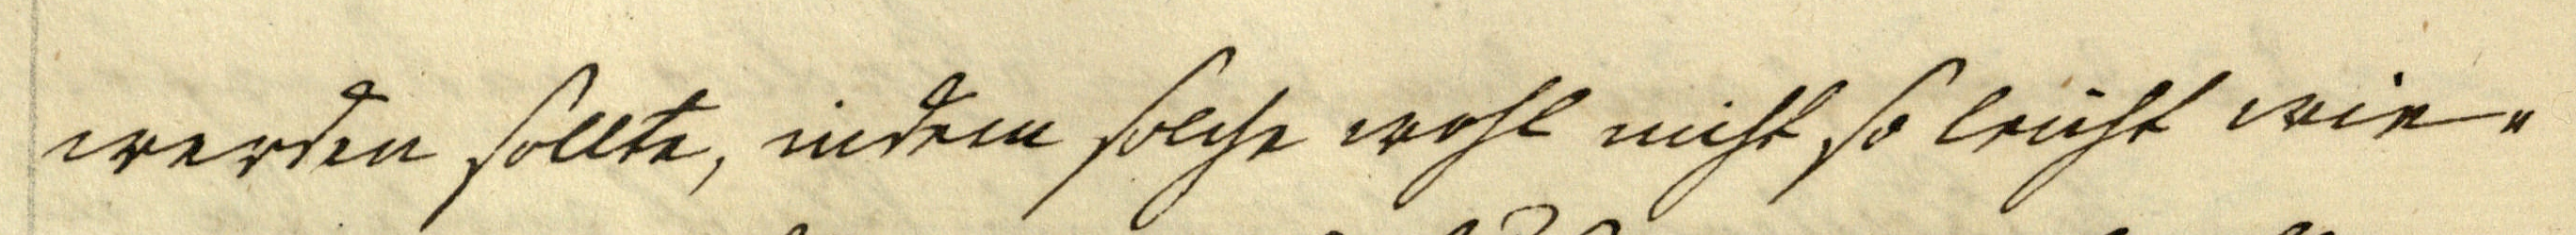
werden sollte, indem solche wohl nicht so leicht wie-
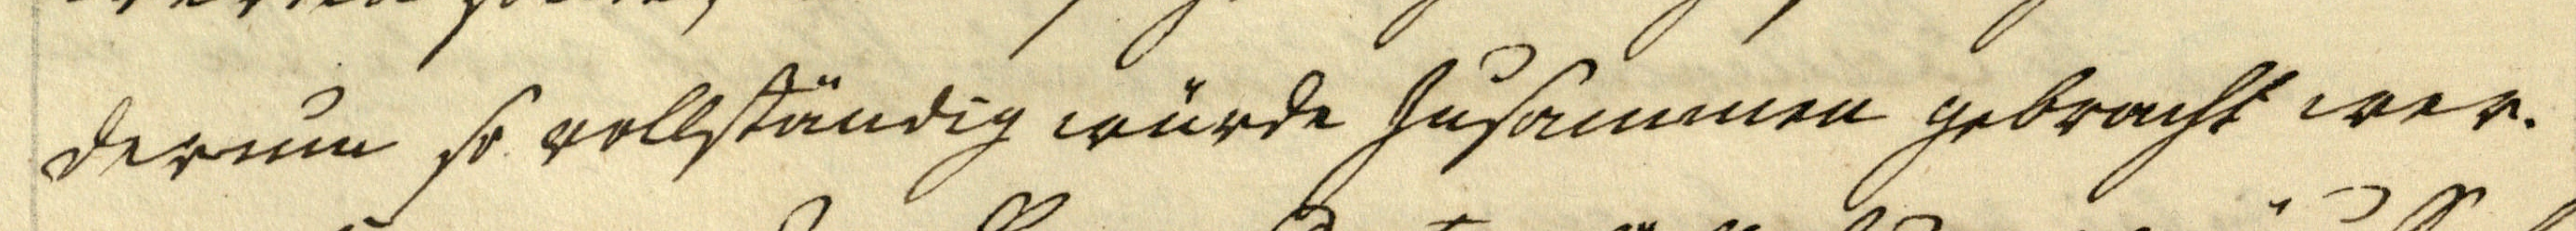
derum so vollständig würde zusammen gebraucht wer-
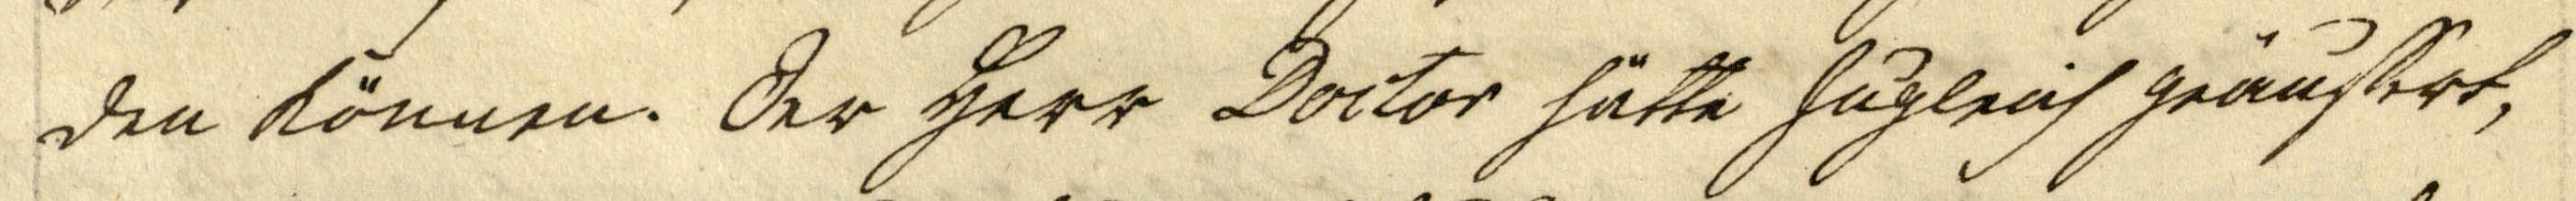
den können. Der Herr Doctor hätte zugleich geäussert,
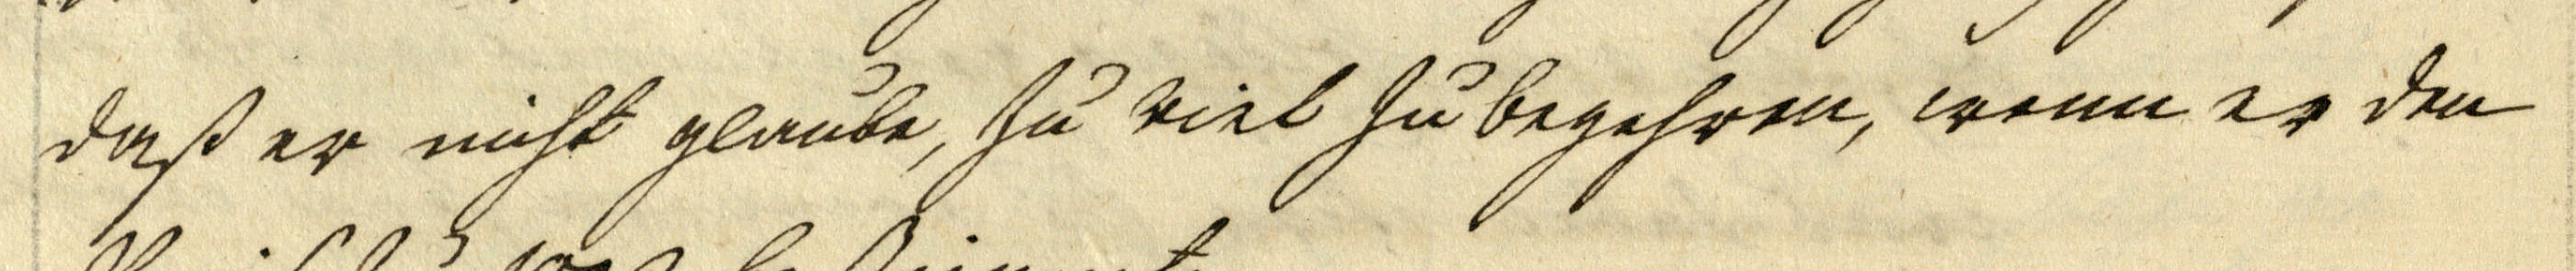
daß er nicht glaube, zu viel zu begehren, wenn er den
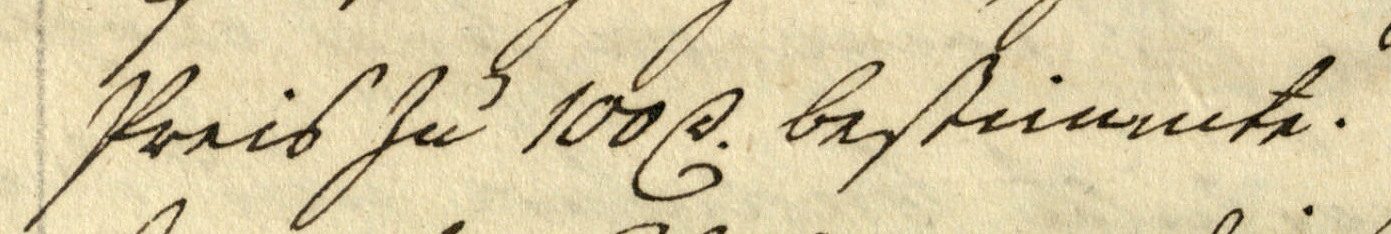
Preis zu 100 rtl bestimmte.
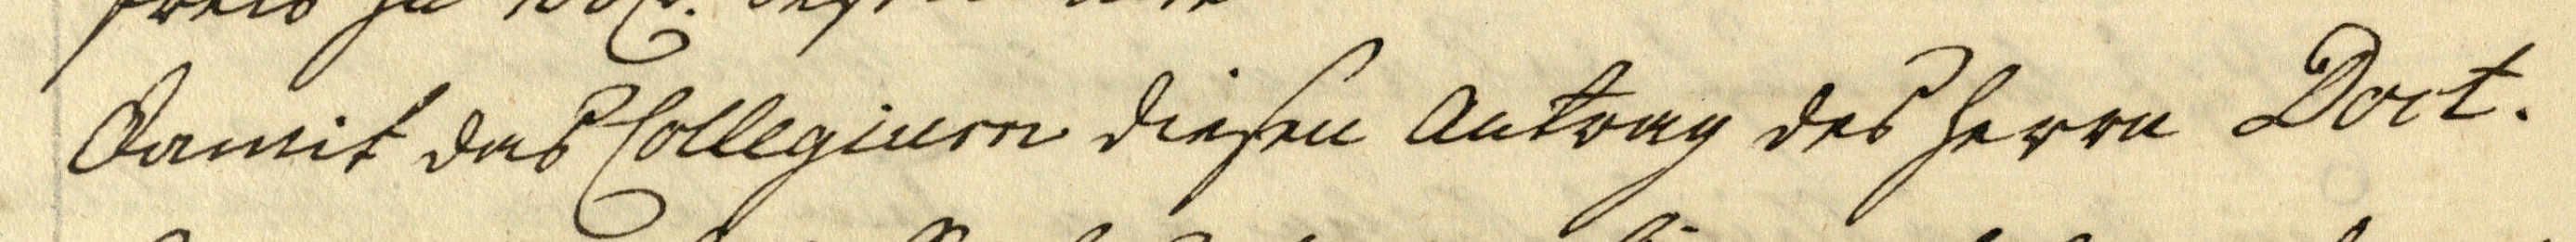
Damit das Collegium diesen Antrag des Herrn Doct.
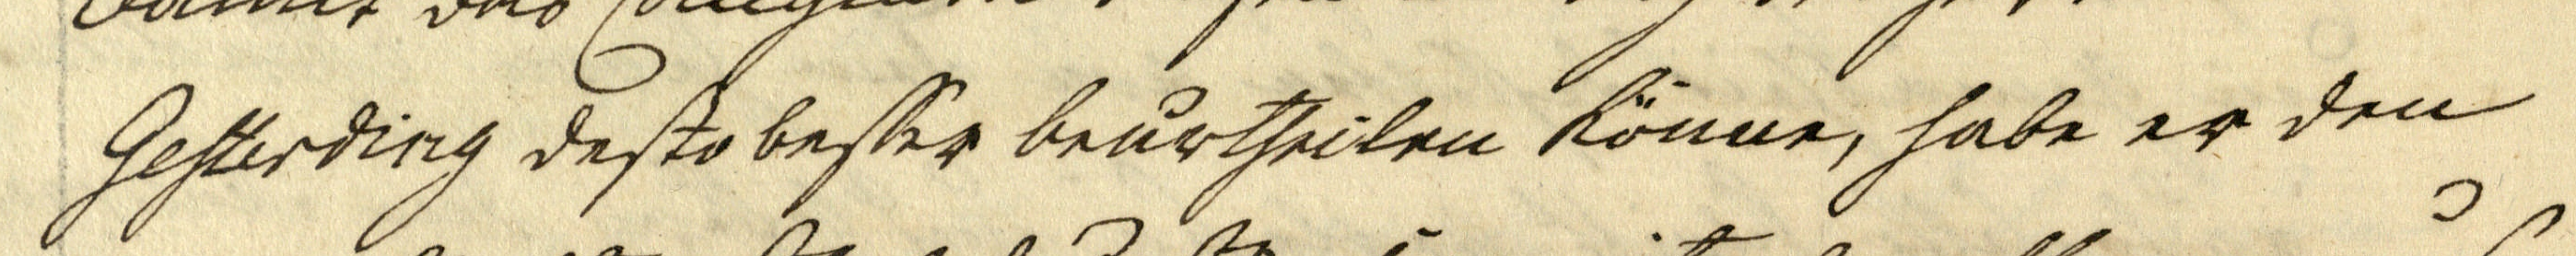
Gesterding desto besser beurtheilen könne, habe er den
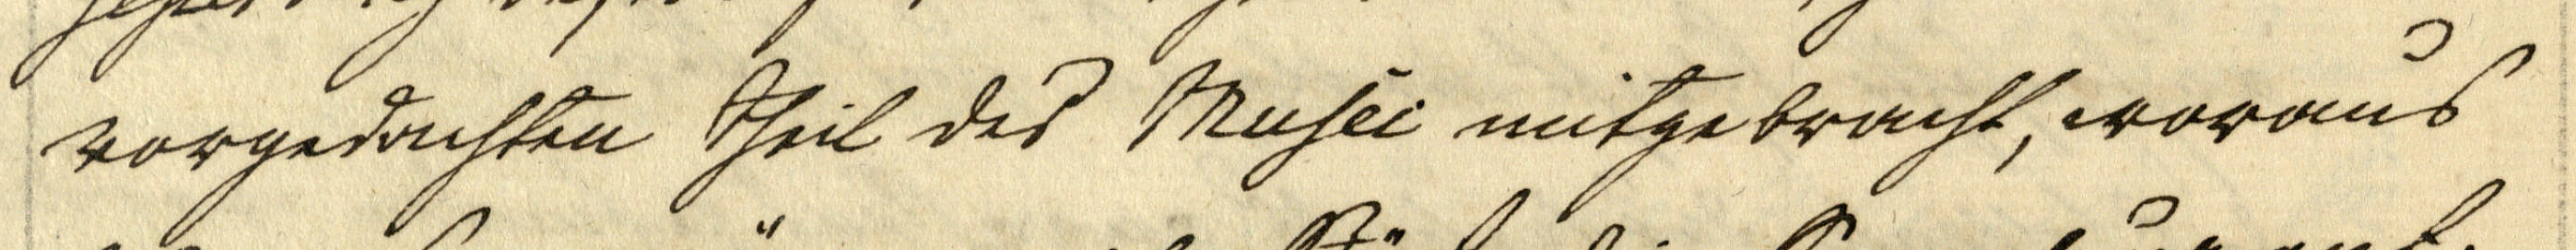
vergedachten Theil des Museo mitgebracht, woraus
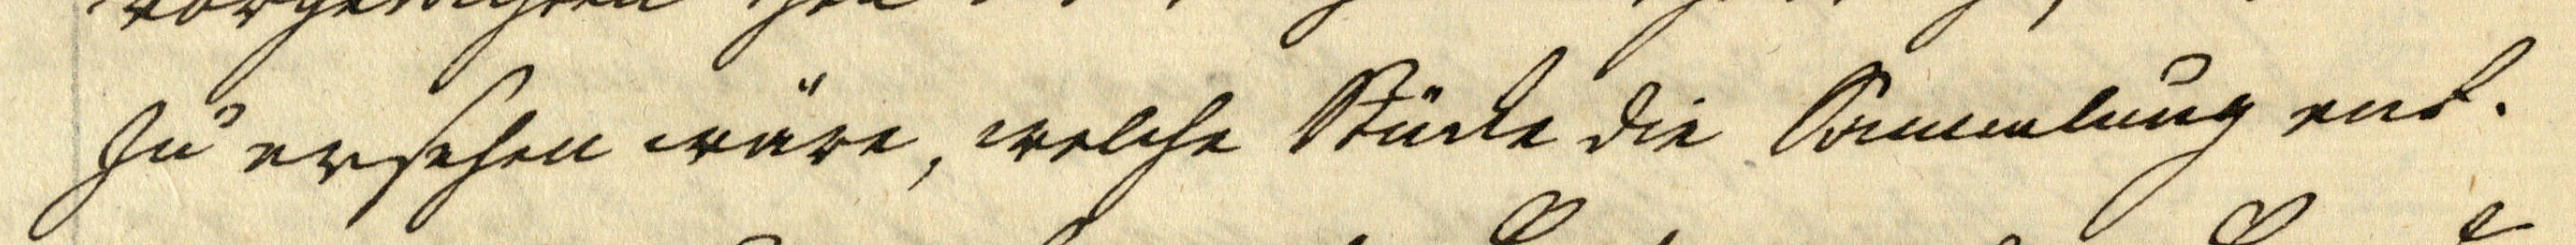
zu ersehen wäre, welche Stücke die Sammlung ent-
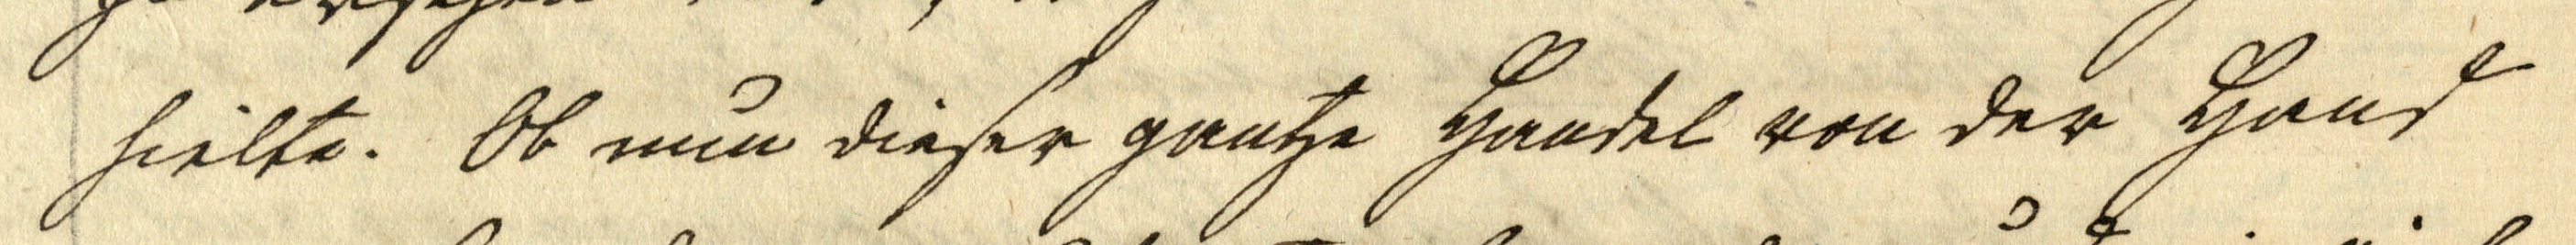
hielte. Ob nun dieser gantze Handel von der Hand
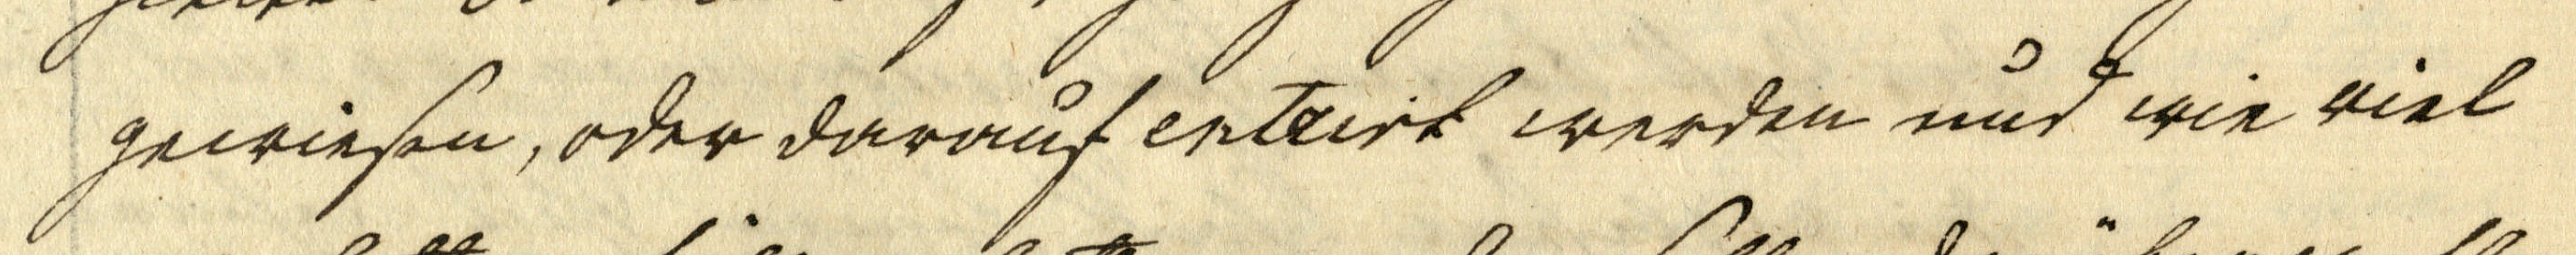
gewiesen, oder darauf entrirt werden und wie viel
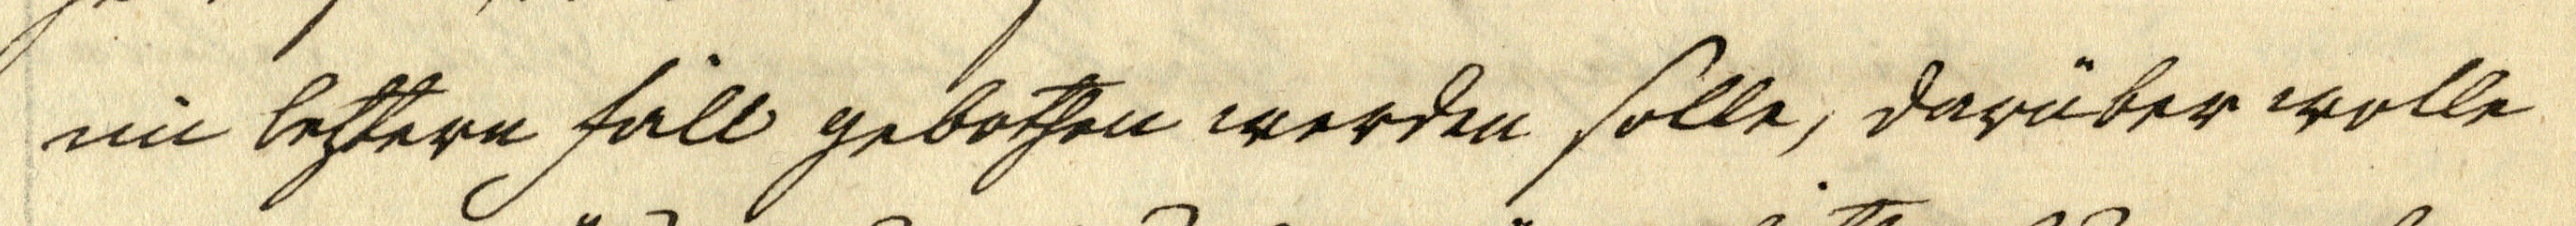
im letztern Fall gebothen werden solle, darüber wolle
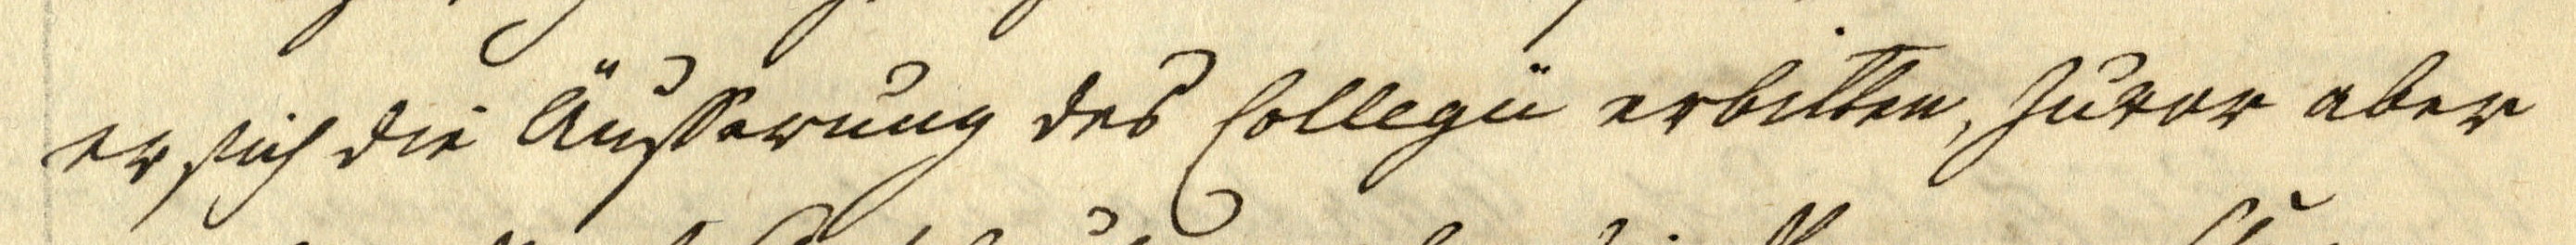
er sich die Äusserung des Collegii erbitten, zuvor aber
